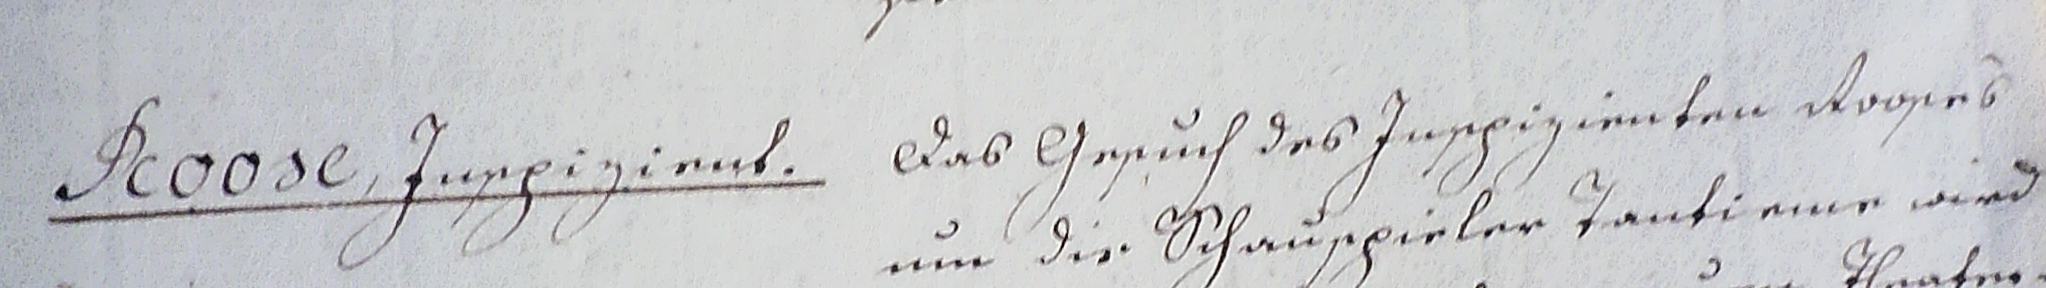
Roose, Inspizient. Das Gesuch des Inspizienten Rooses
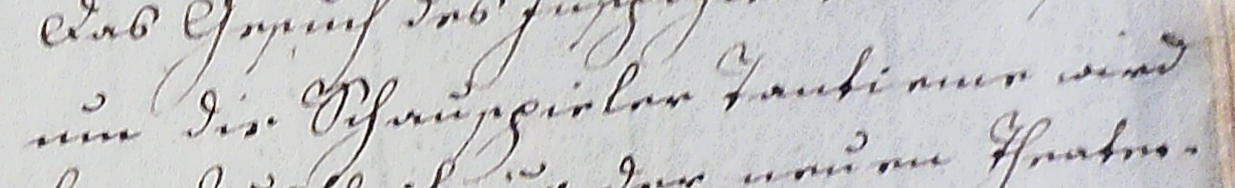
um die Schauspieler Tantieme wird
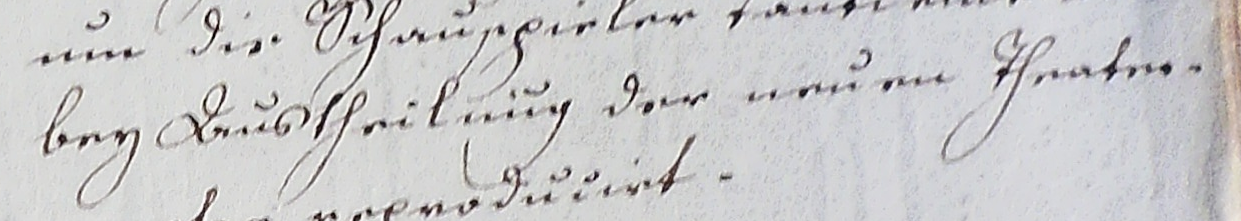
bey Austheilung der neuen Theater¬
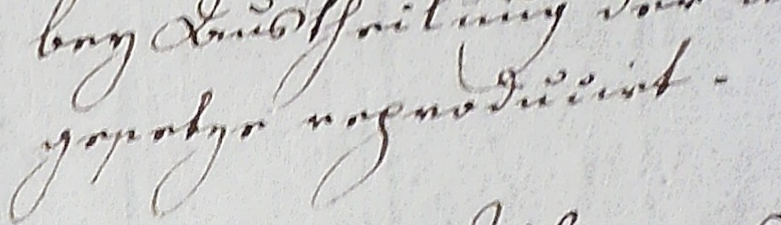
gesetze reproducirt.
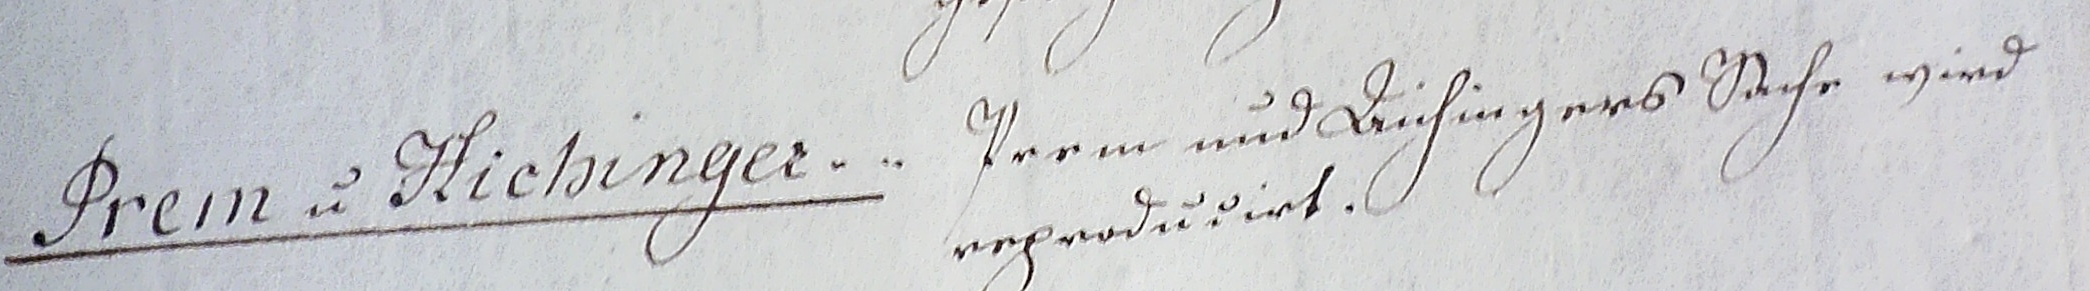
Prem u Aichinger .. .. Pren und Aichingers Sache wird
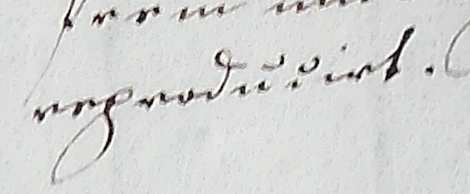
reproducirt.
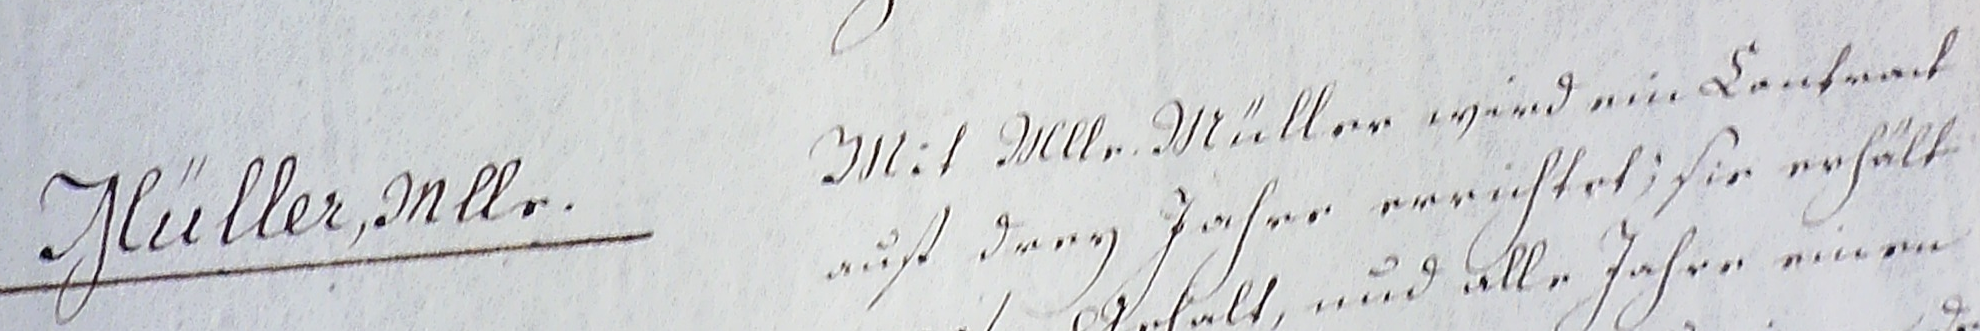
Müller, Mlle. Mit Mlle. Müaller wird ein Contract
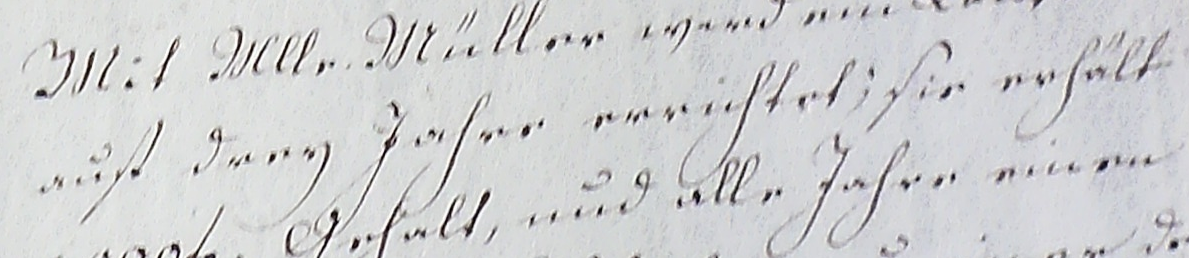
auf drey Jahre errichtet; sie erhält
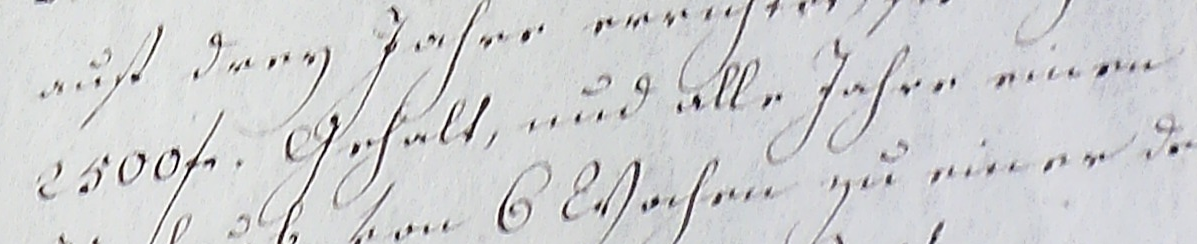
2500fr. Gehalt, und alle Jahre einen
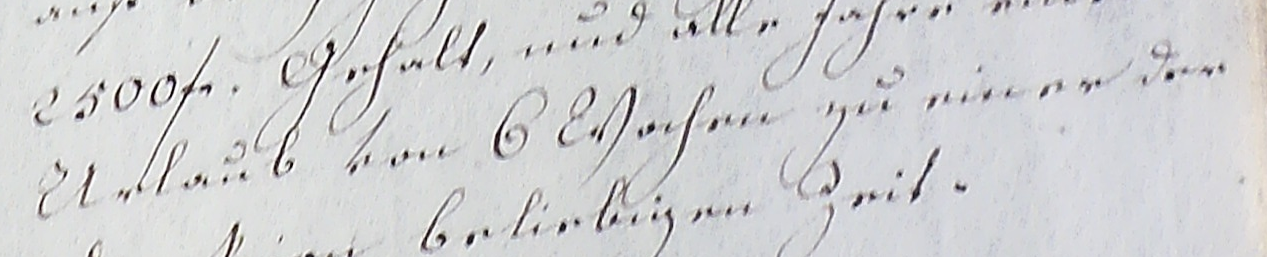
Urlaub von 6 Wochen zu einer der
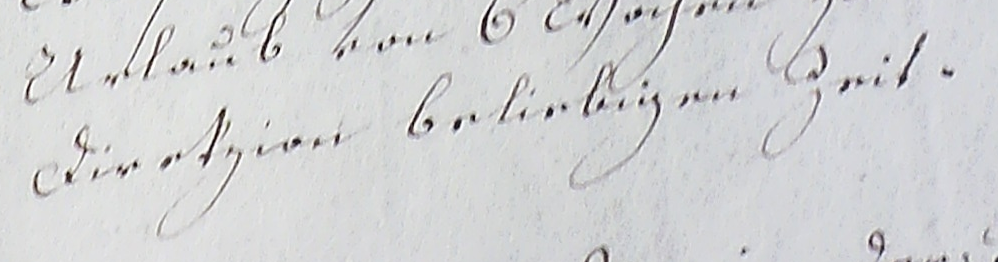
Direkzion beliebigen Zeit.
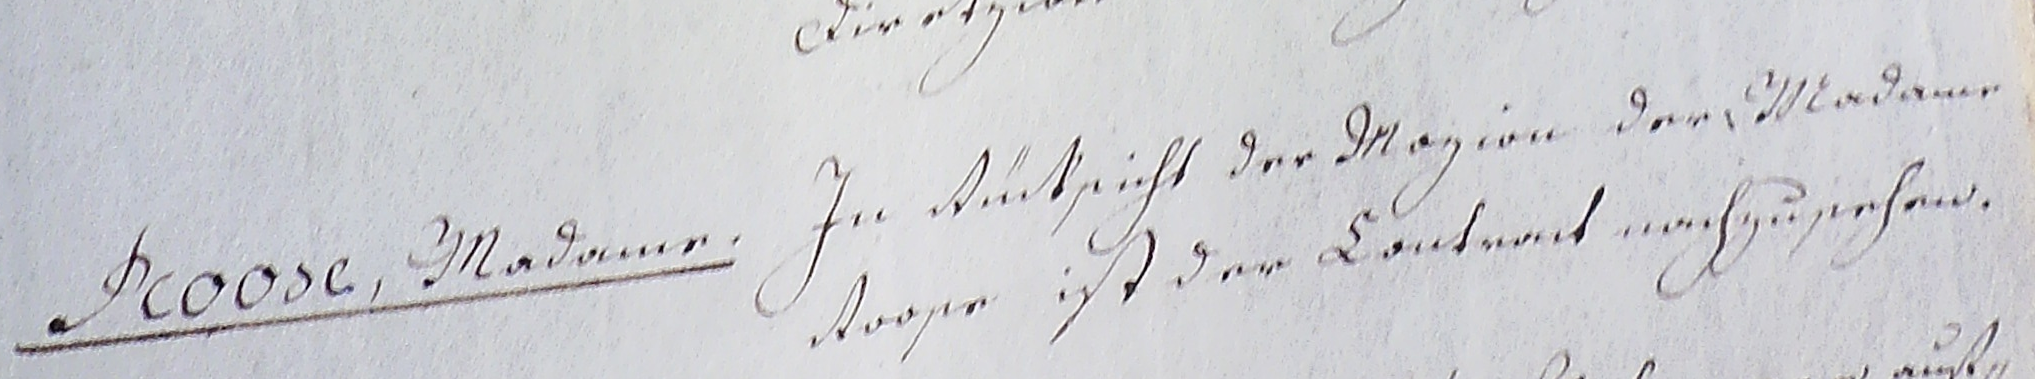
Roose, Madame. In Rücksicht der Mozion der Madame
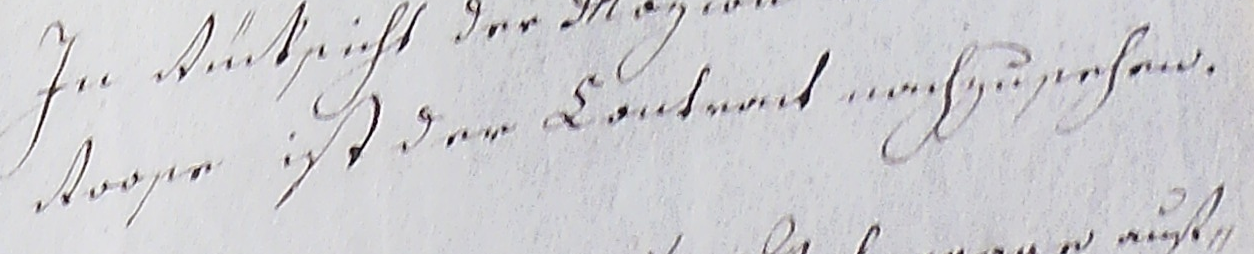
Roose ist der Contranct nachzusehen.
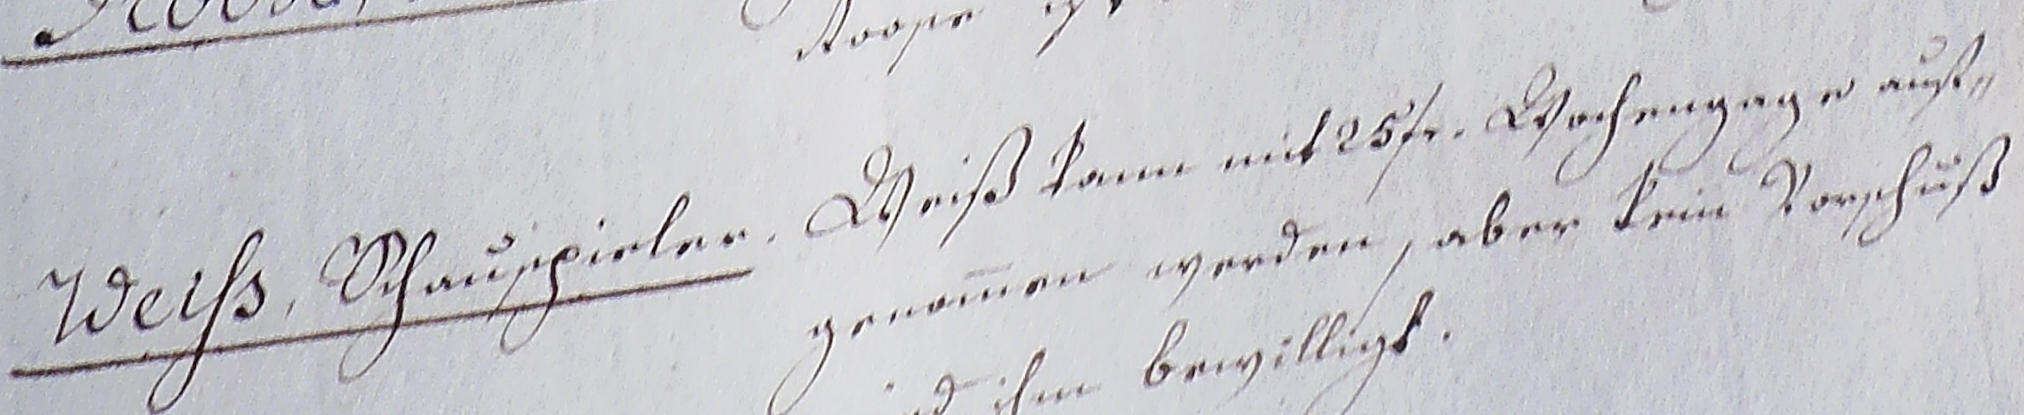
Weiss, Schauspieler. Weiß kann mit 25fr. Wochengage auf¬
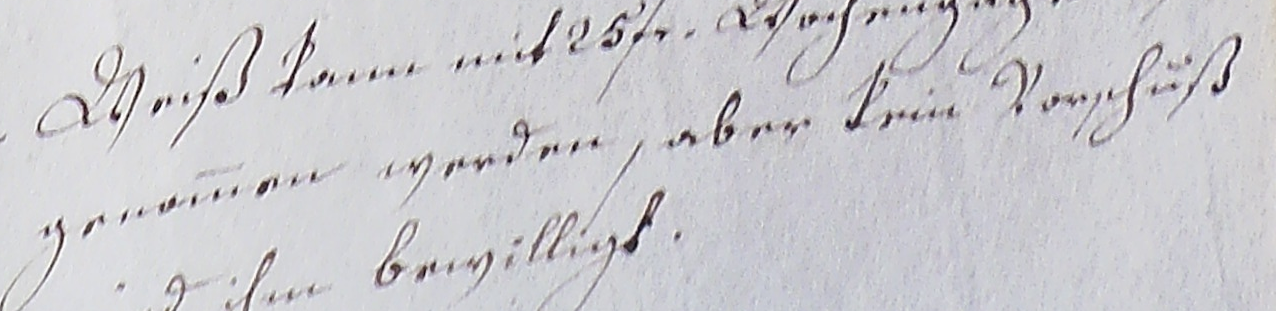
genom̅en werden, aber kein Vorschuß
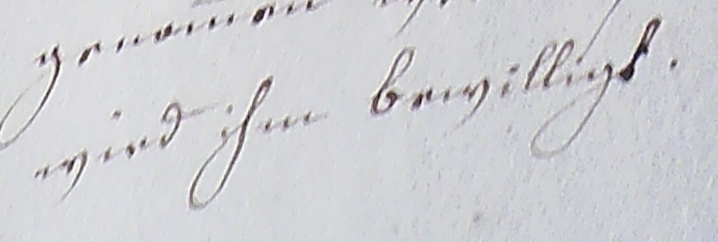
wird ihm bewilligt.
